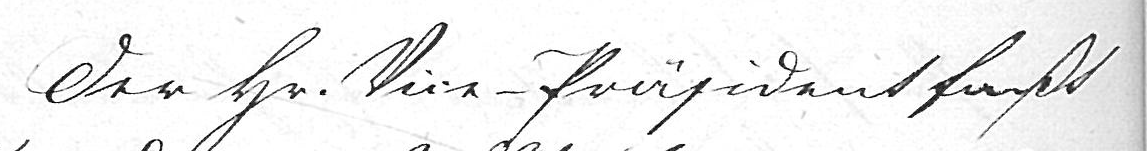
Der Hr. Vice-Präsident faßt
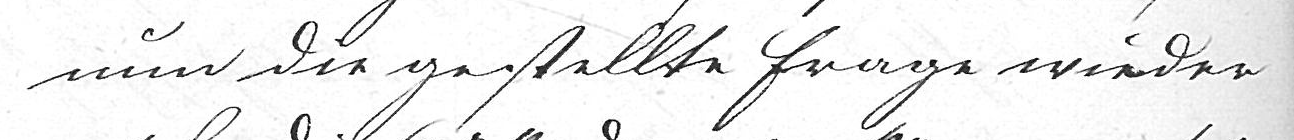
nun die gestellte Frage wieder
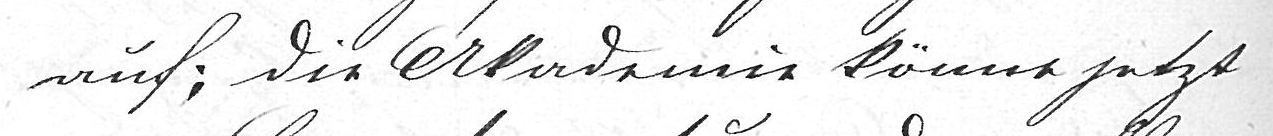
auf; die Akademie könne jetzt
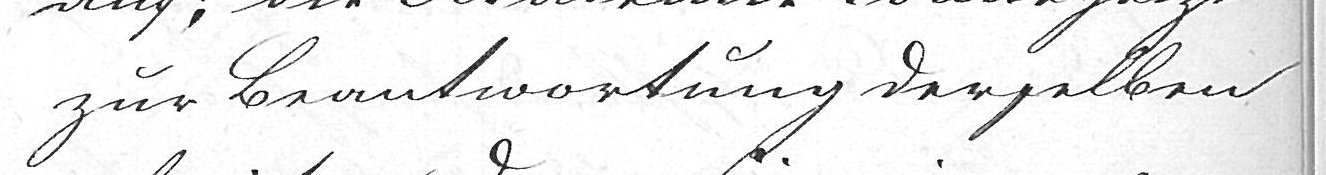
zur Beantwortung derselben
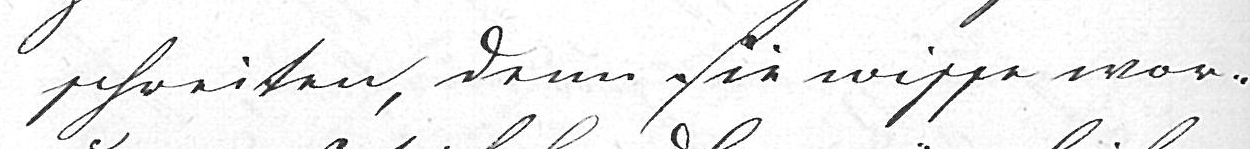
schreiten, denn sie wisse wor-
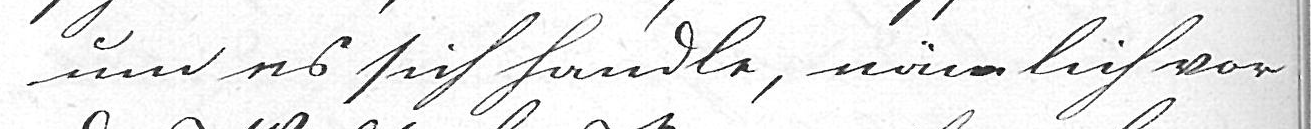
um es sich handle, nämlich vor
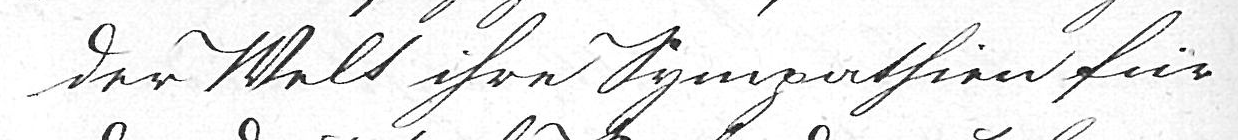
der Welt ihre Sympathien für
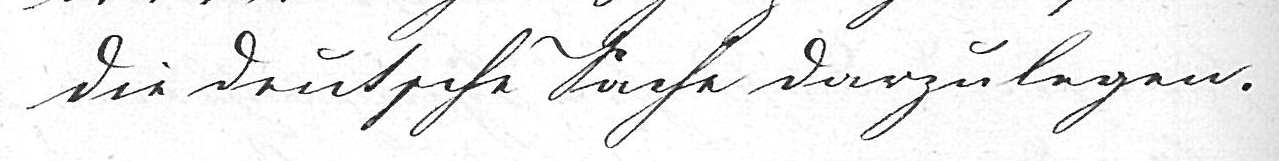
die deutsche Sache darzulegen.
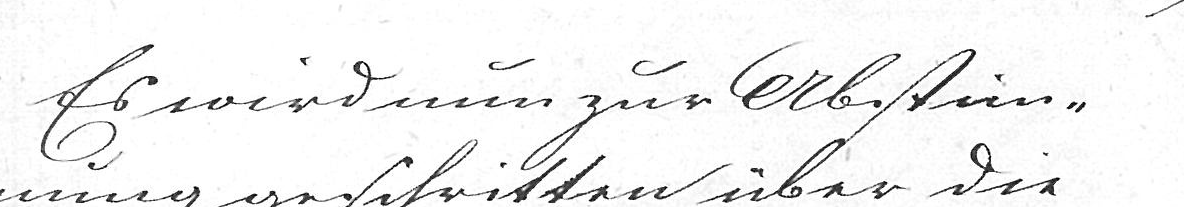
Es wird nun zur Abstim-
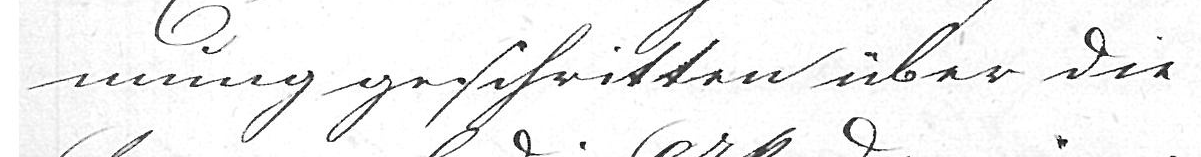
mung geschritten über die
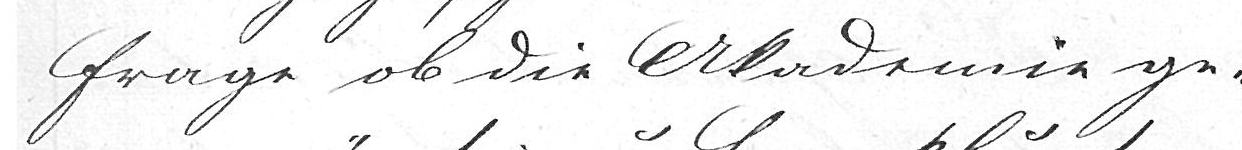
Frage ob die Akademie ge-
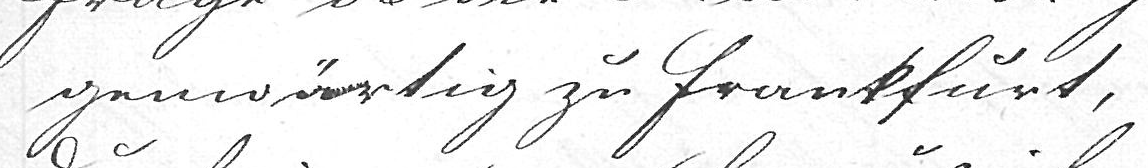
genwärtig zu Frankfurt,
